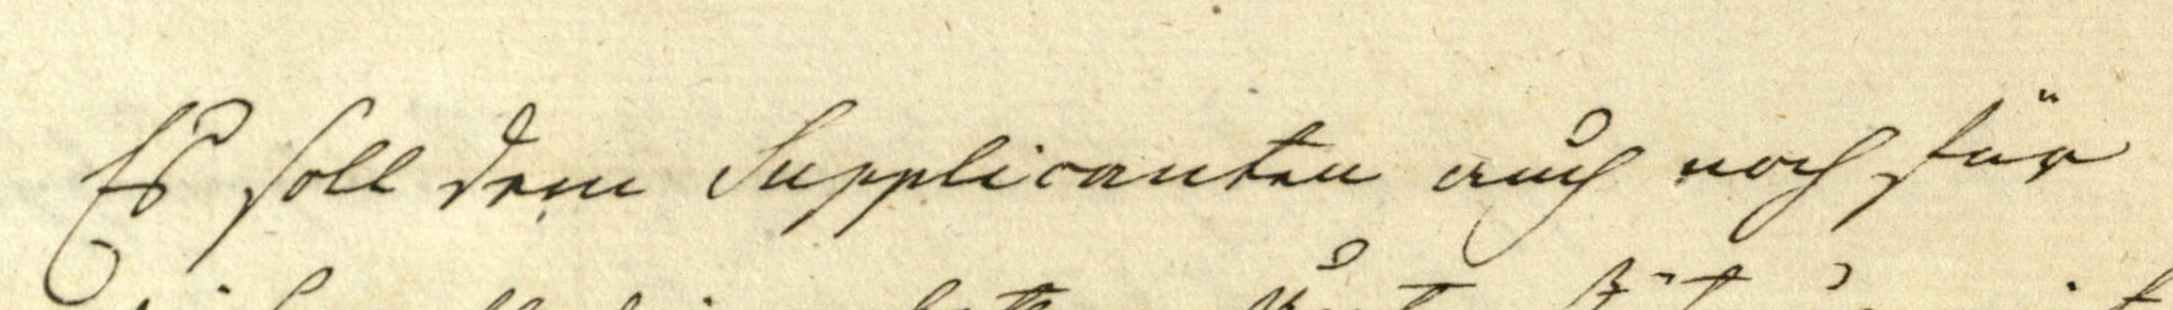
Es soll dem Supplicanten auch noch für
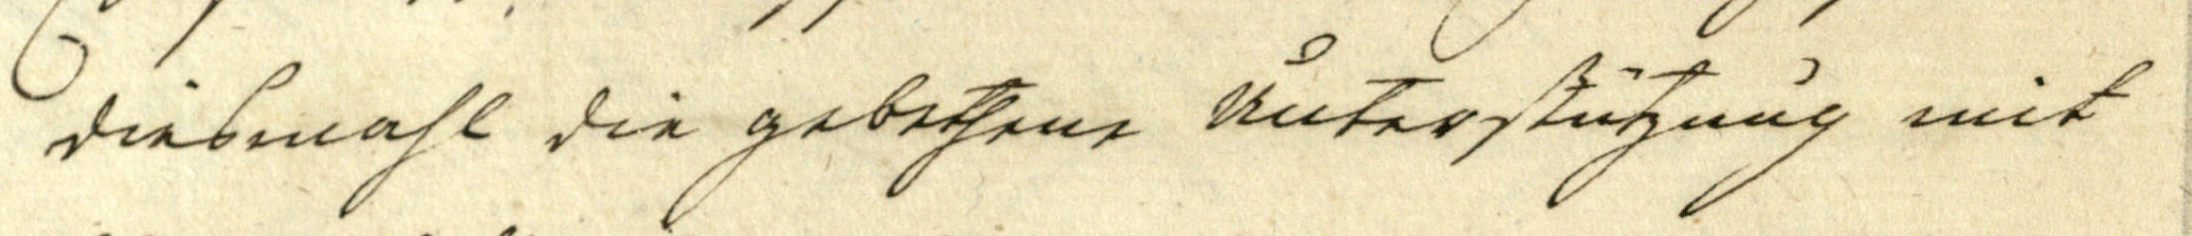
diesmahl die gebethene Unterstützung mit
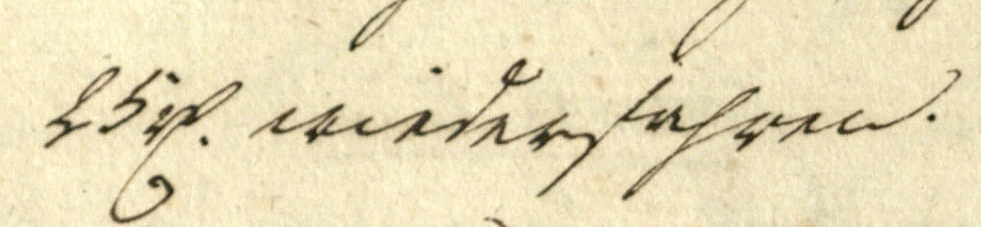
25 rl. wiederfahren.
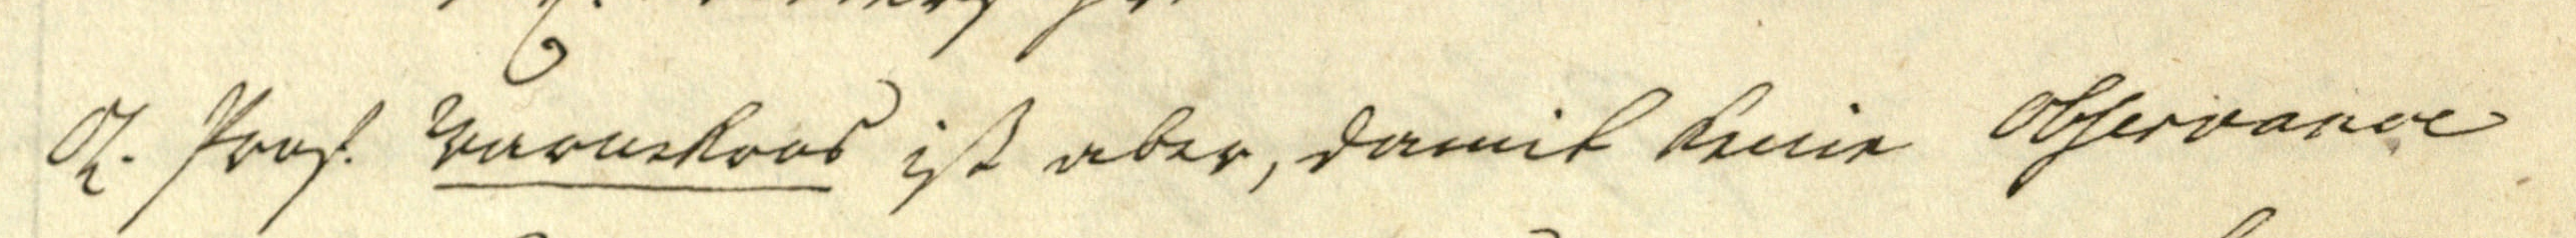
dh. Prof. Warnekros ist aber, damit keine Observance
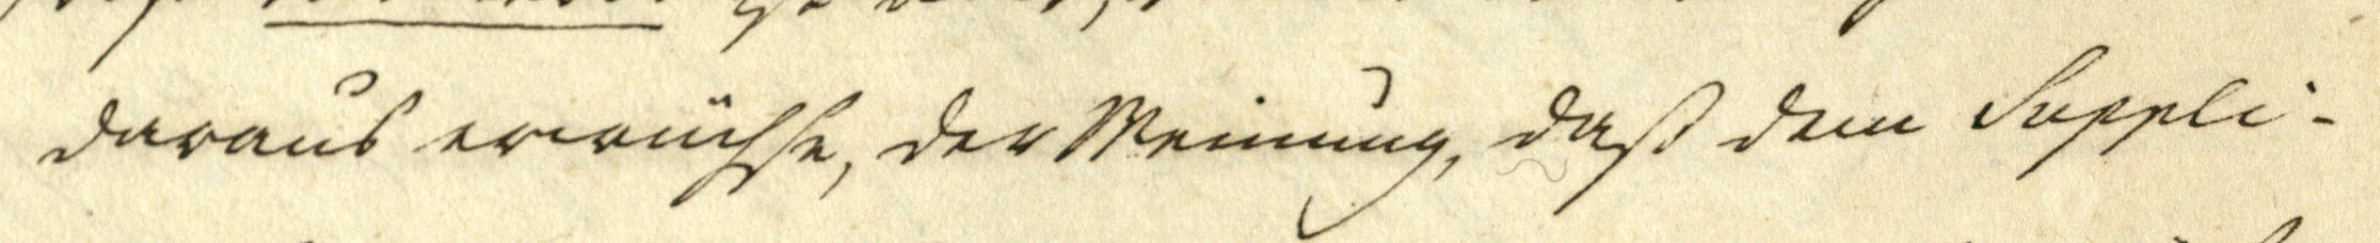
daraus erwüchse, der Meinung, daß dem Suppli¬
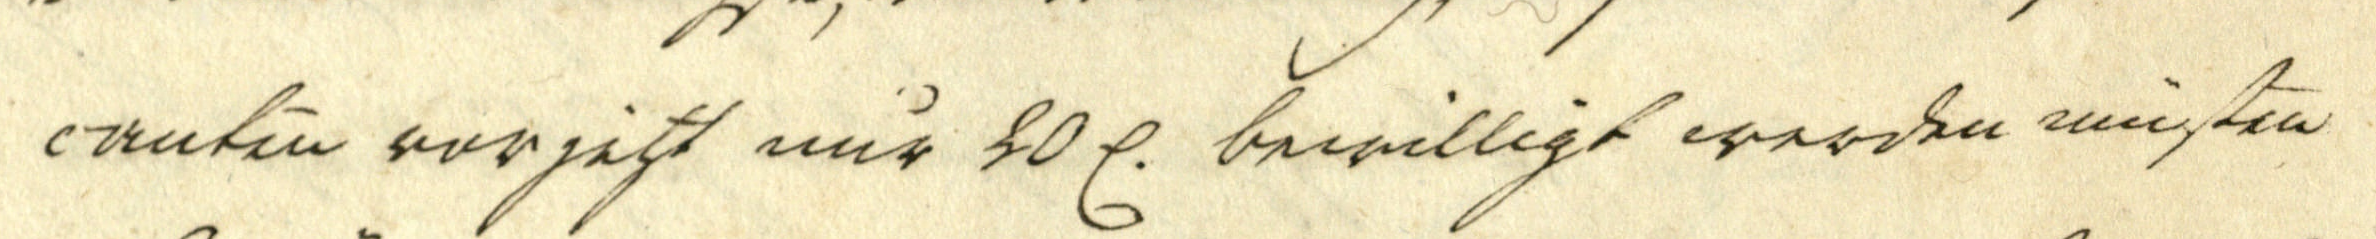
canten vor jetzt nur 20 l. bewilligt werden müsten
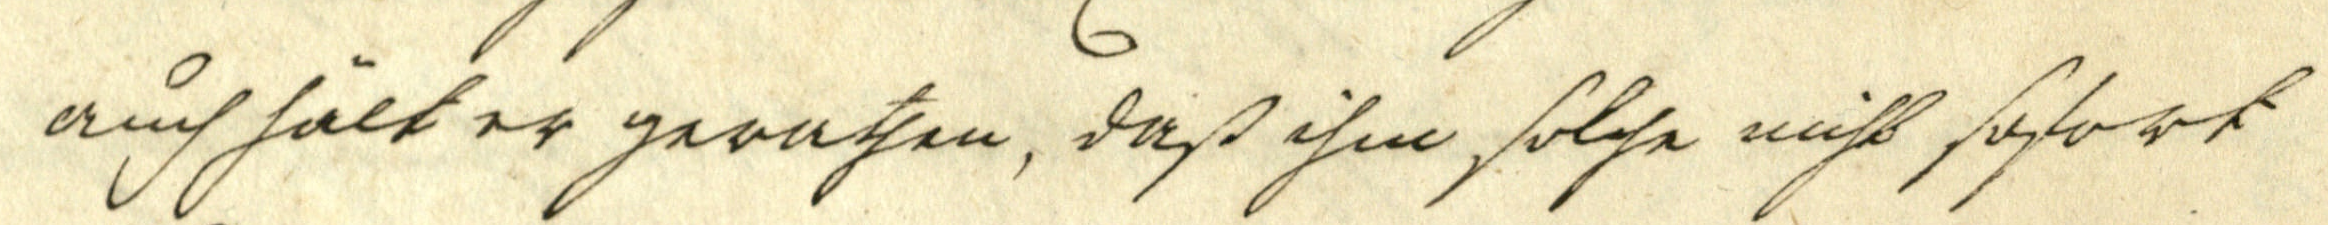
auch hält er gerathen, daß ihm solche nicht sofort
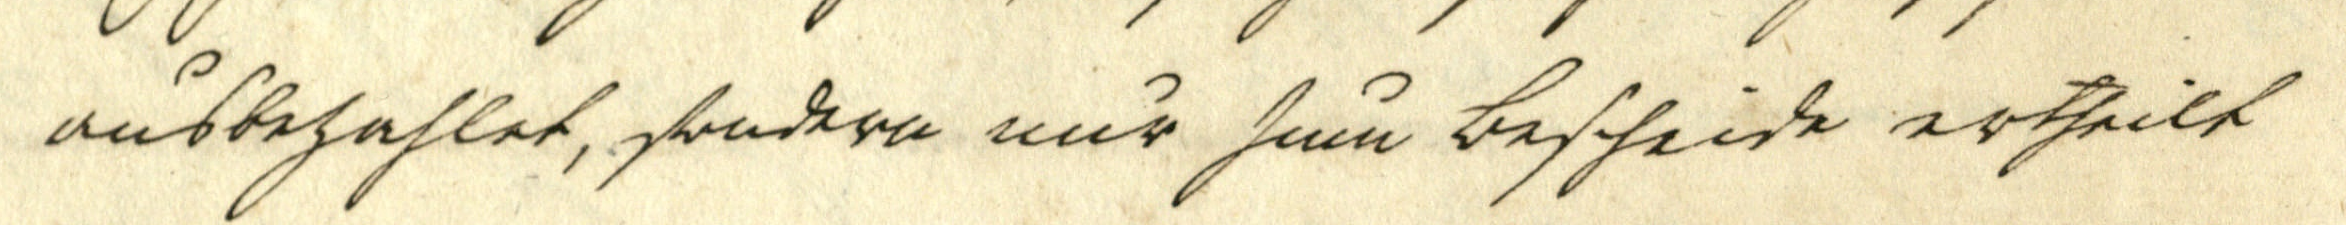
ausbezahlet, sondern nur zum Bescheide ertheilt
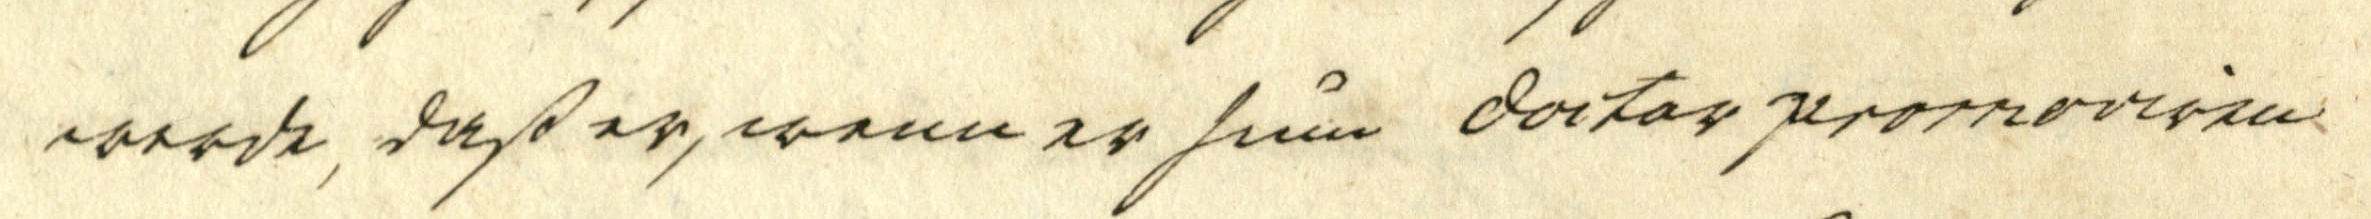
werde, daß er, wenn er zum Doctor promoviren
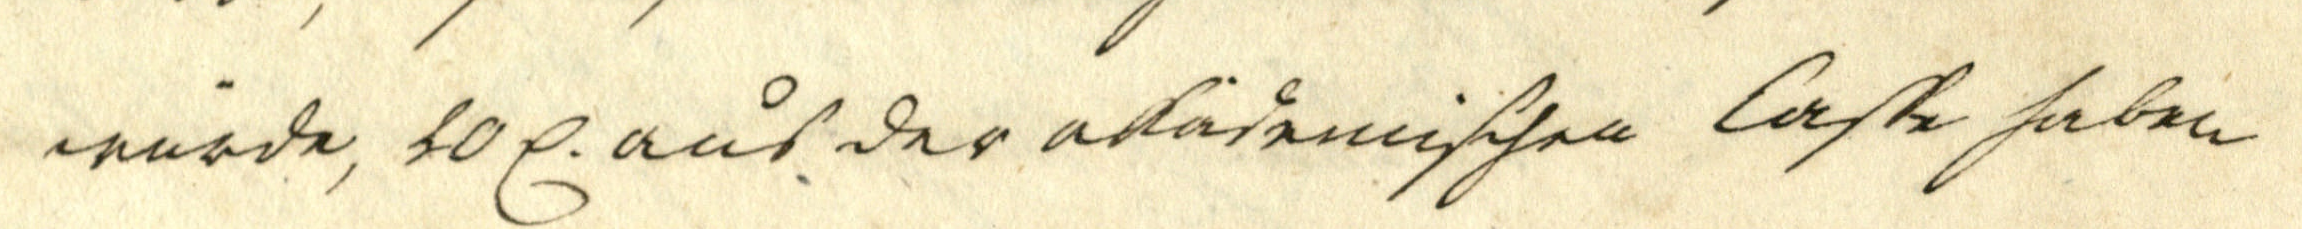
würde, 20 l. aus der akademischen Casse haben
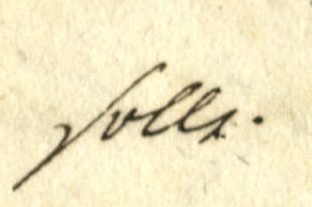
solle.
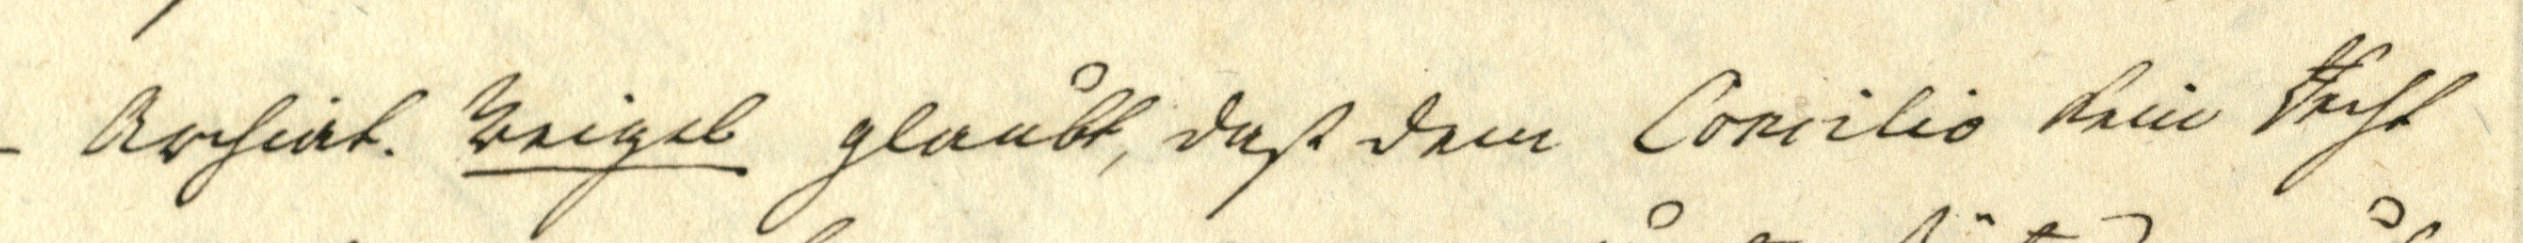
Archiat. Weigel glaubt, daß dem Concilio kein Recht
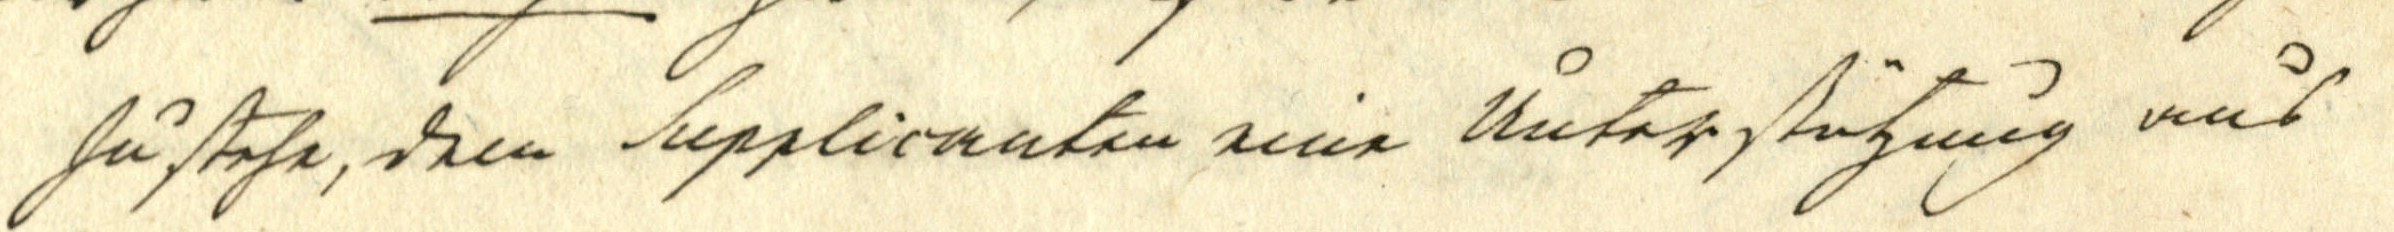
zustehe, dem Supplicanten eine Unterstützung aus
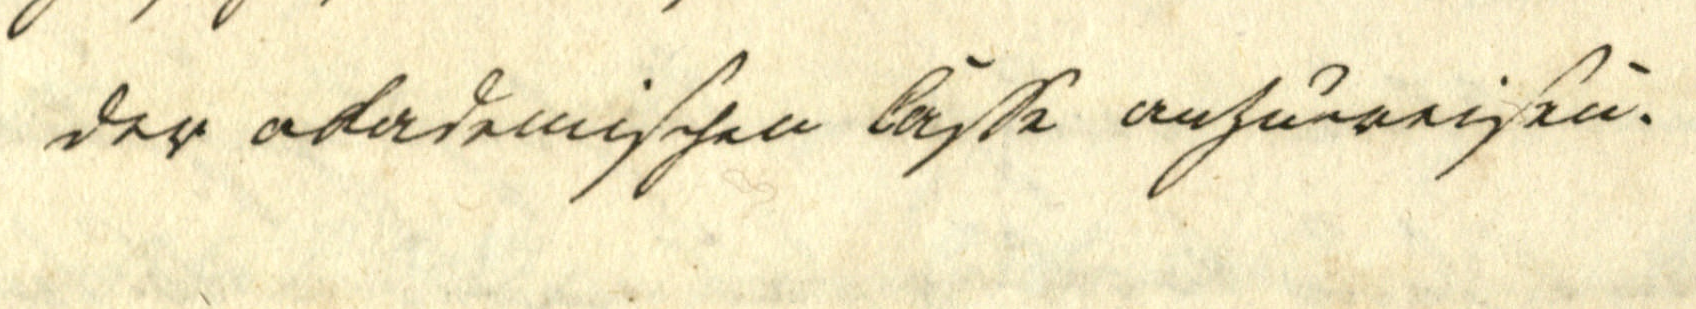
der akademischen Casse anzuweisen.
